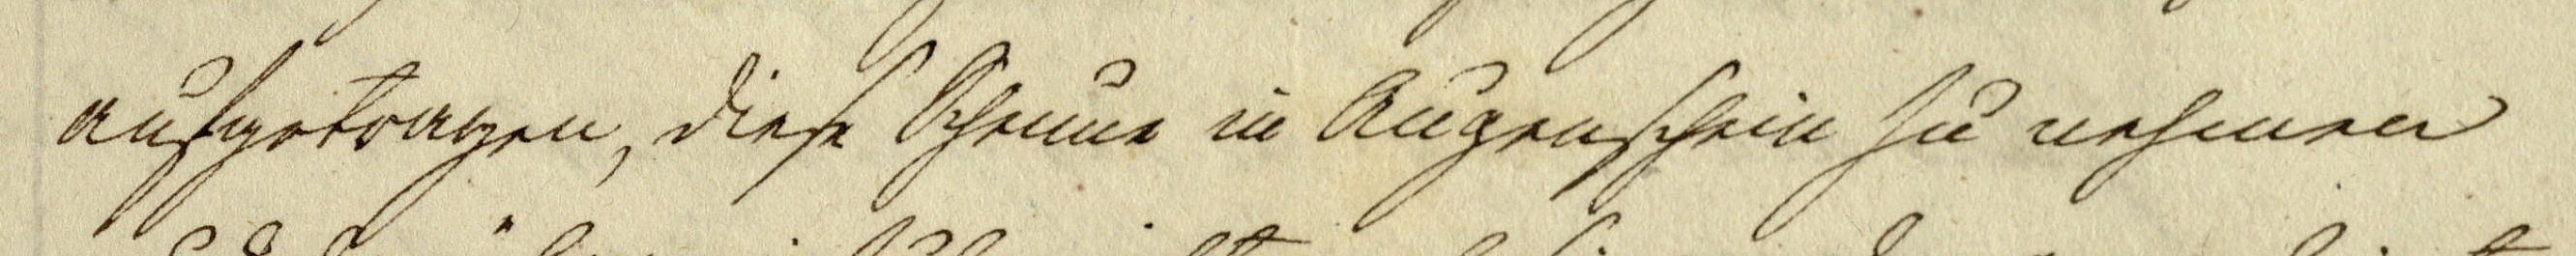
aufgetragen, diese Scheune in Augenschein zu nehmen
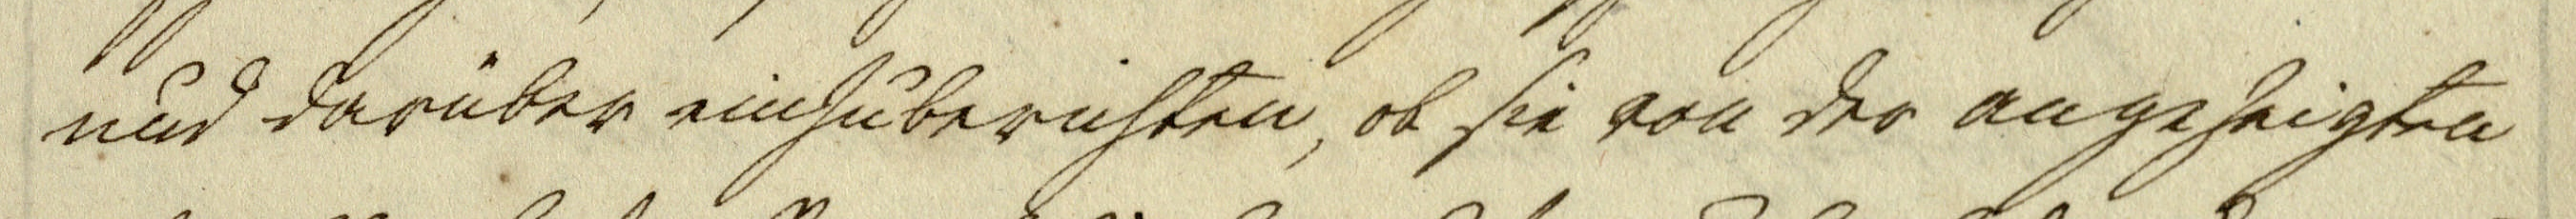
und darüber einzuberichten, ob sie von der angezeigten
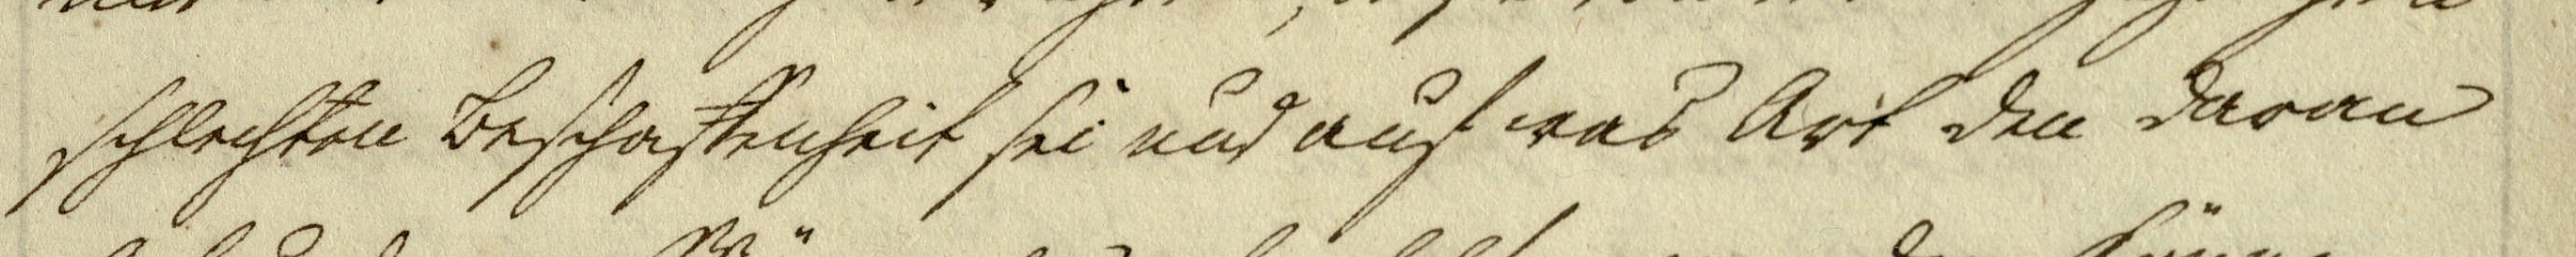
schlechten Beschaffenheit sei und auf was Art den daran
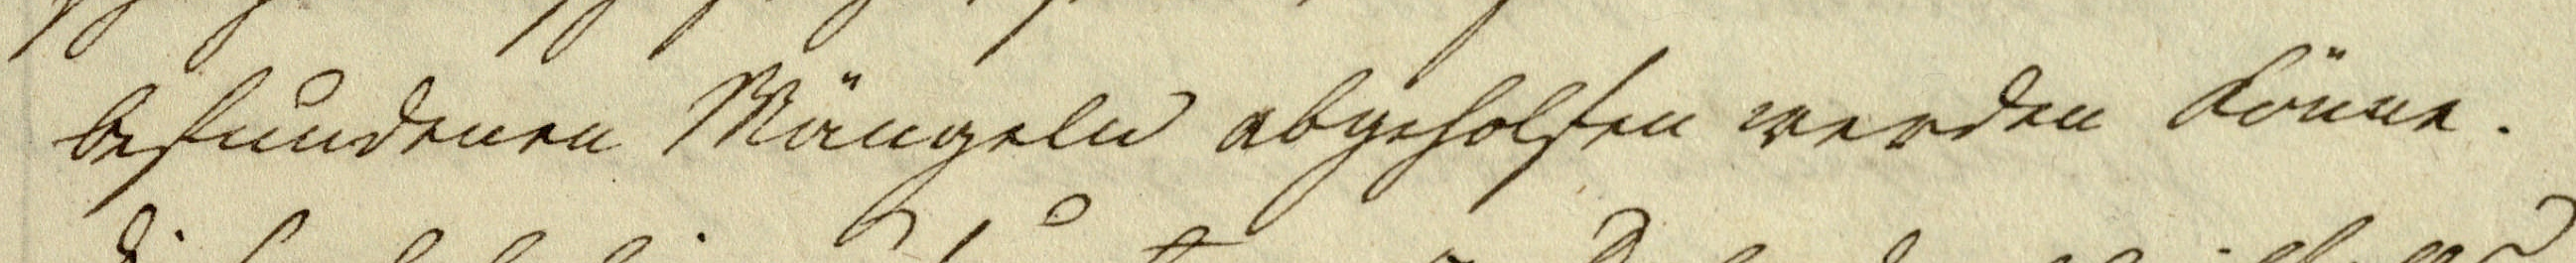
befundenen Mängeln abgeholfen werden könne.
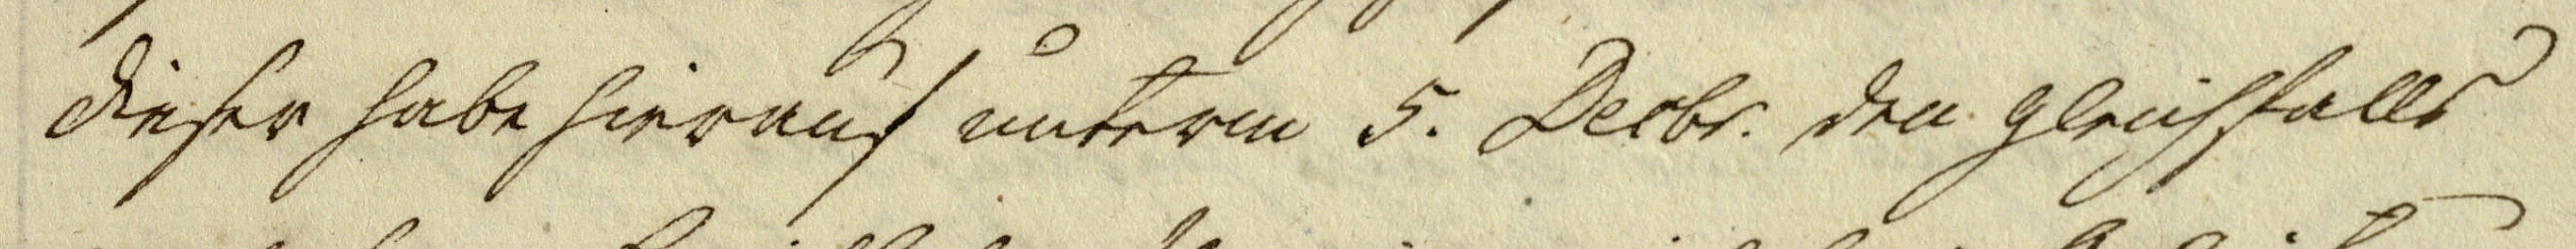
Dieser habe hierauf unterm 5. Decbr. den gleichfalls
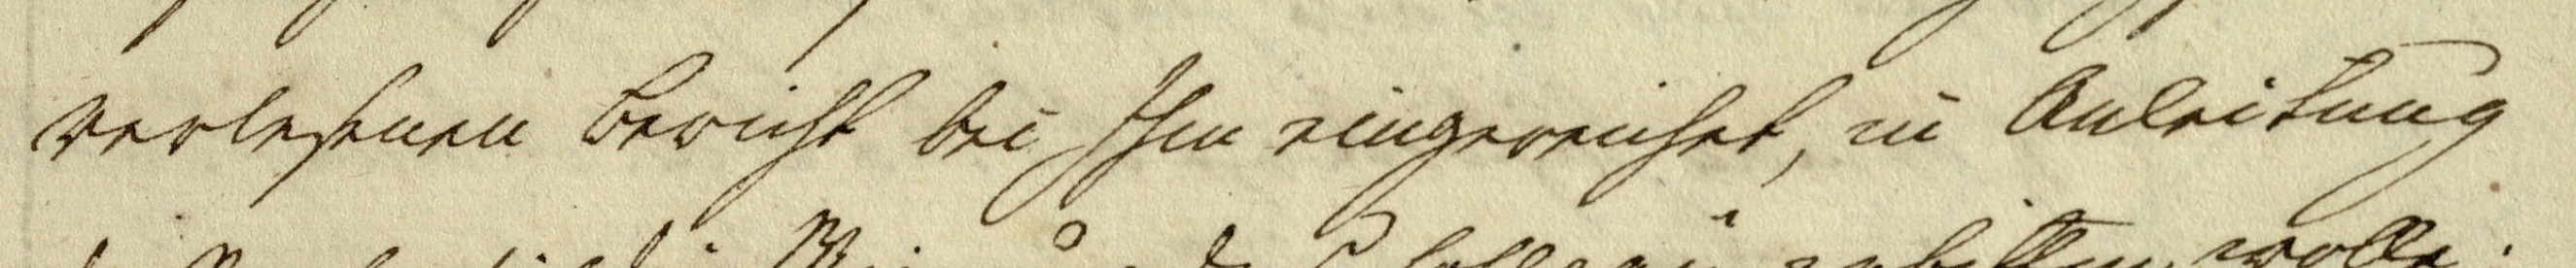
verlesenen Bericht bei Ihm eingereichet, in Anleitung
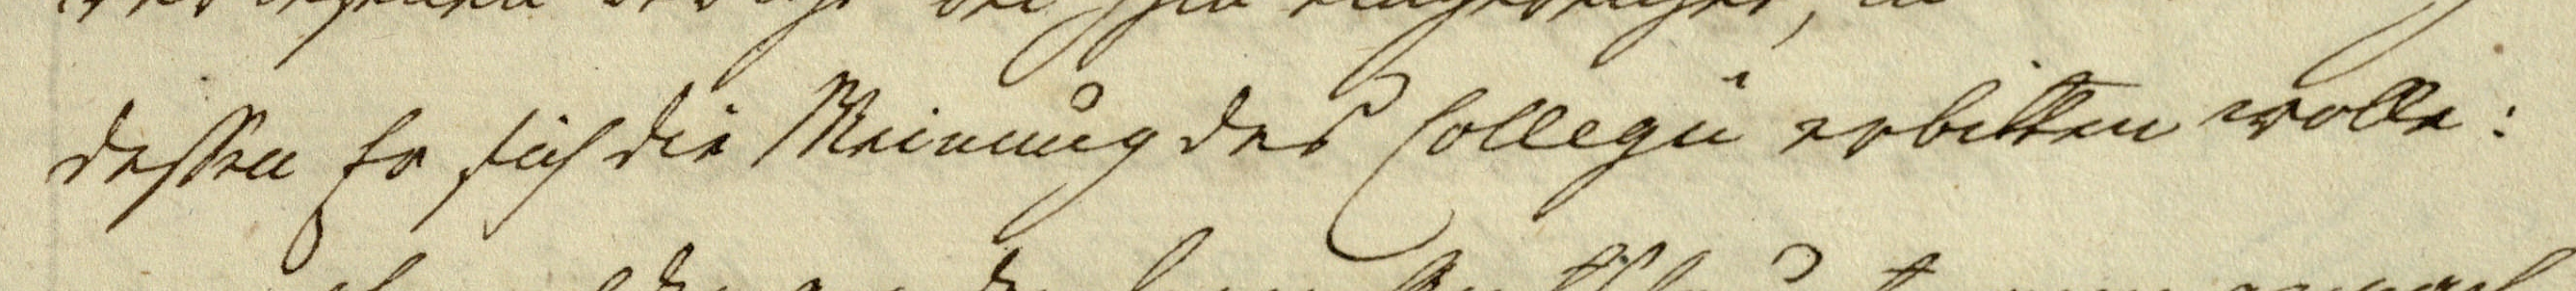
dessen Er sich die Meinung des Collegii erbitten wolle:
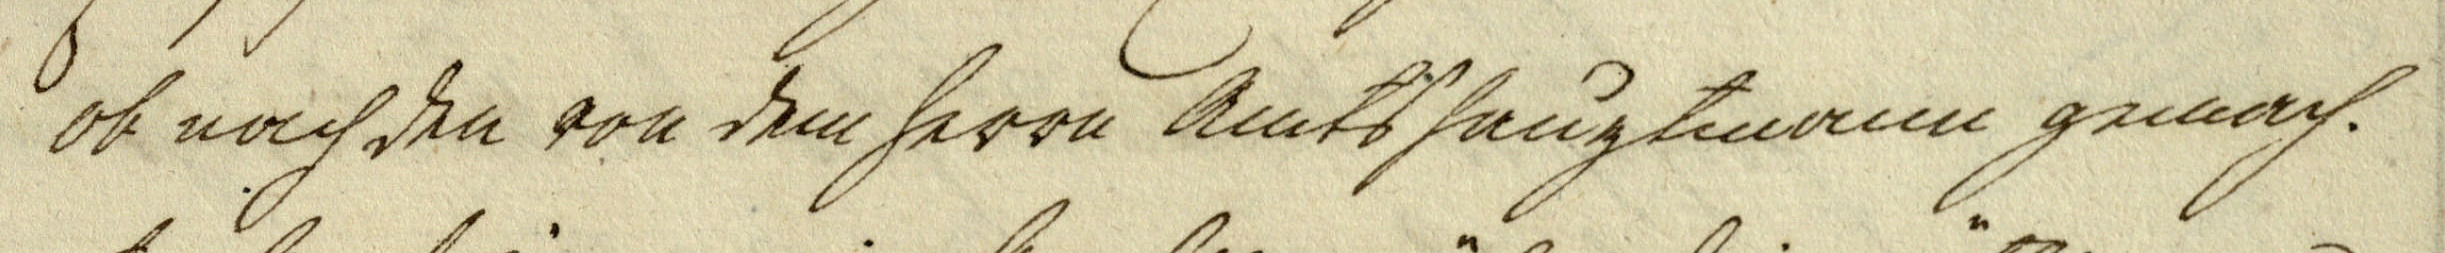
ob nach den von dem Herrn Amtshauptmann gemach¬
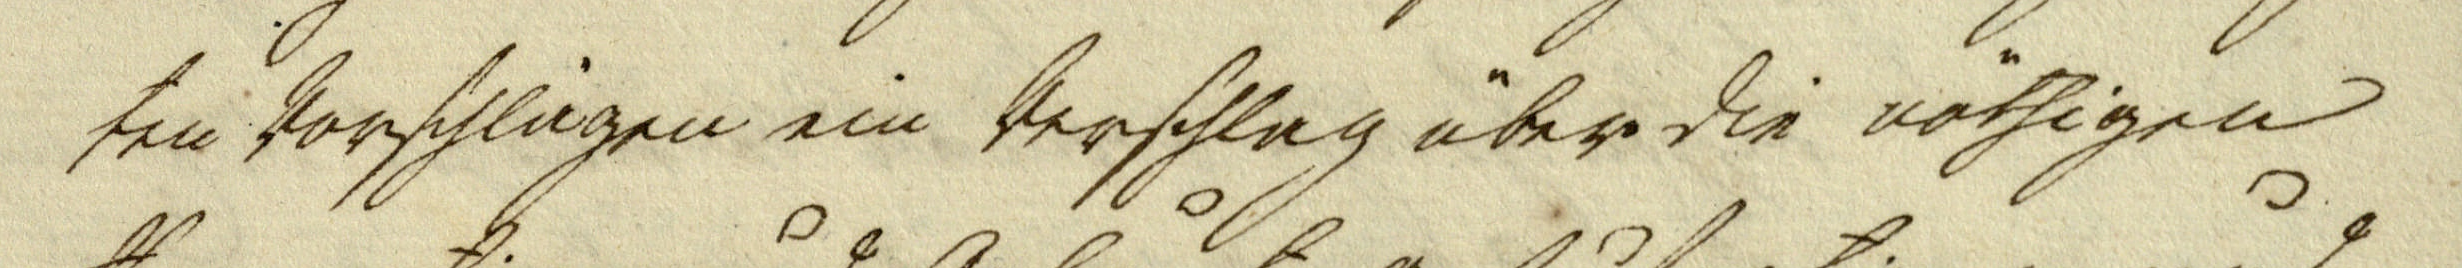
ten Vorschlägen ein Verschlag über die nöthigen
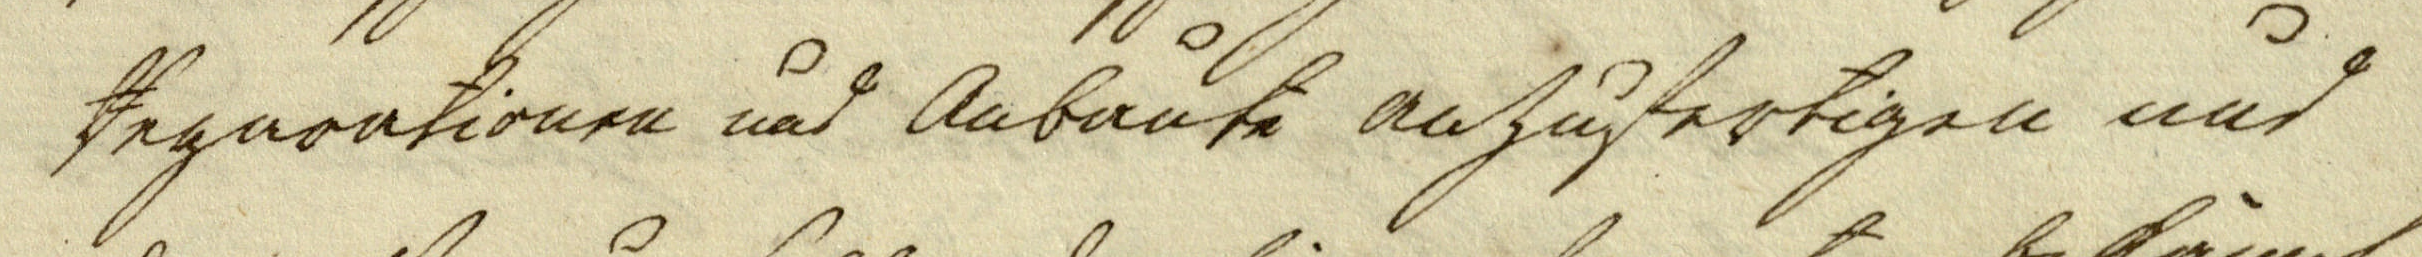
Reparationen und Anbaute anzufertigen und
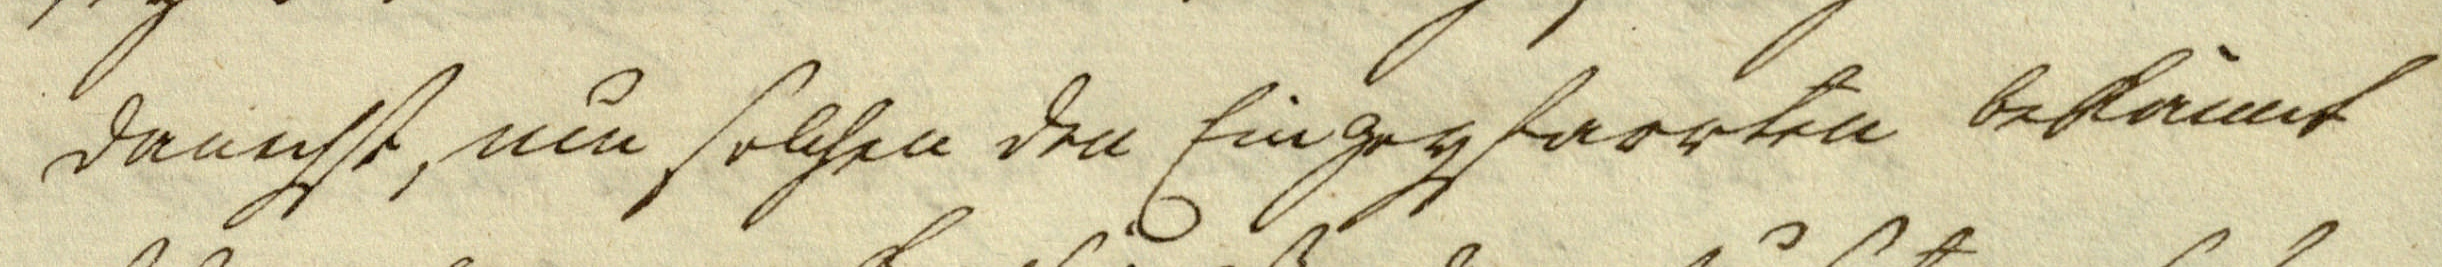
danechst, um solchen den Eingepfarrten bekannt
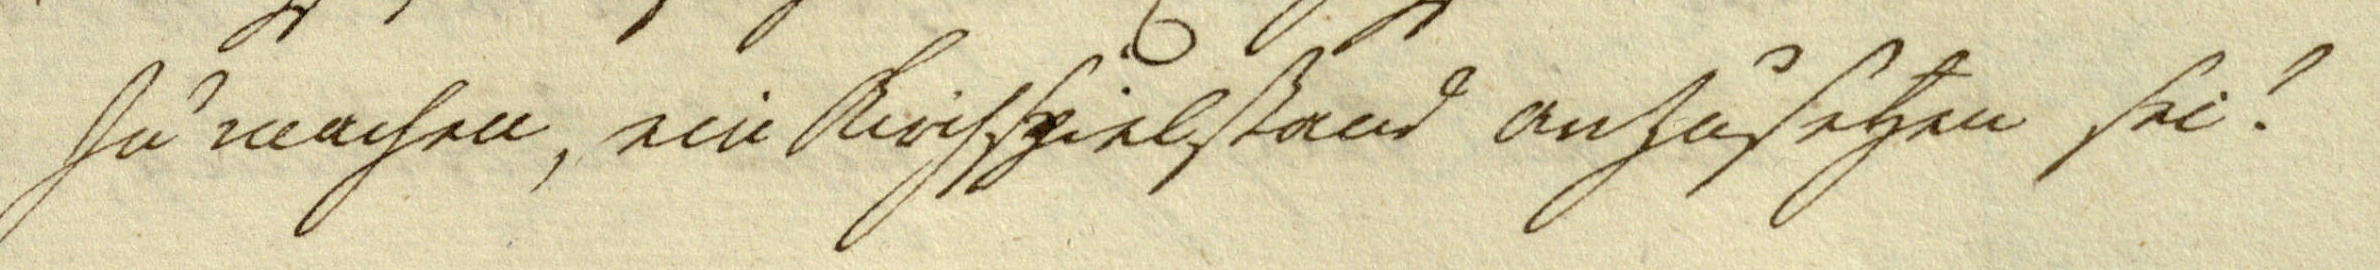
zu machen, ein Kirchspielstand anzusetzen sei?
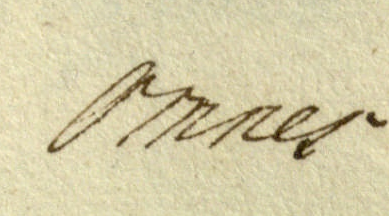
Omnes
